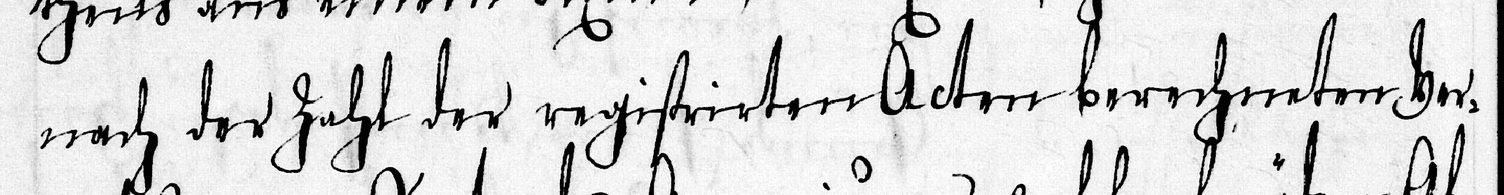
nach der Zahl der registrirten Acten berechneten Ver¬
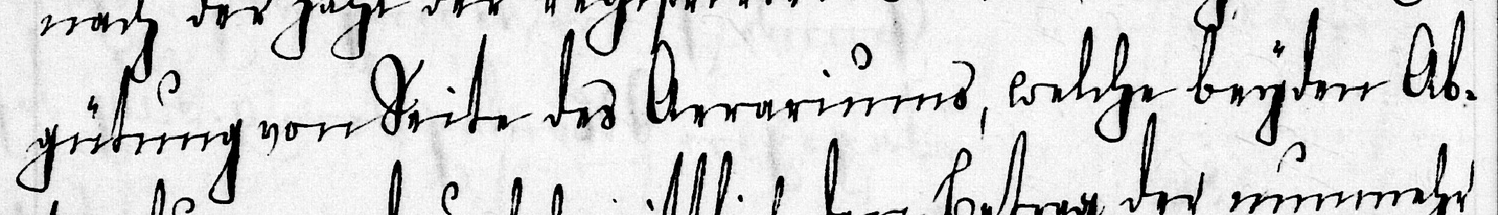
gütung von Seite des Aerariums, welche beyden Ab¬
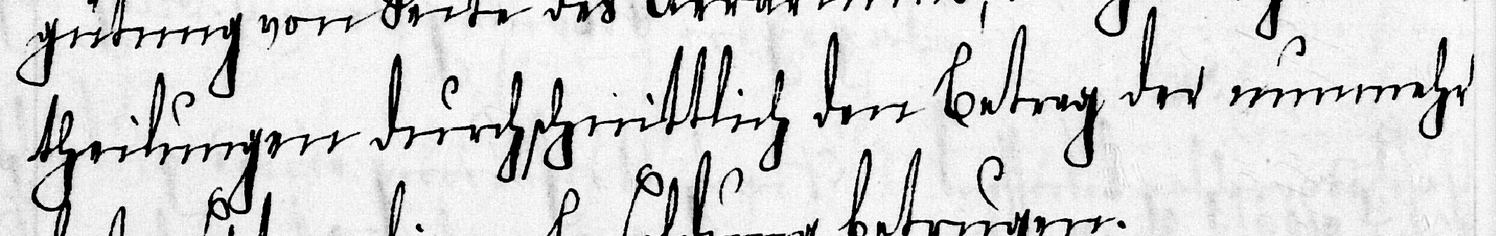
theilungen durchschnittlich den Betrag der nunmehr
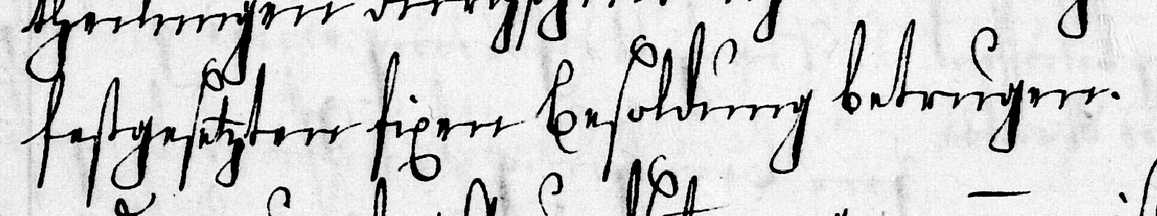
festgesetzten fixen Besoldung betrugen.
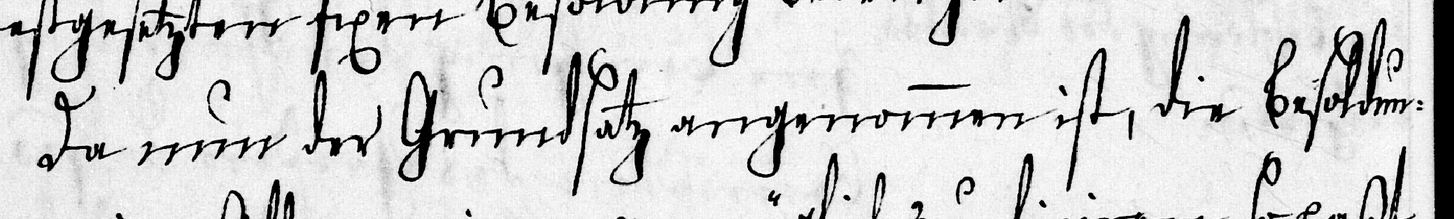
Da nun der Grundsatz angenommen ist, die Besoldu¬
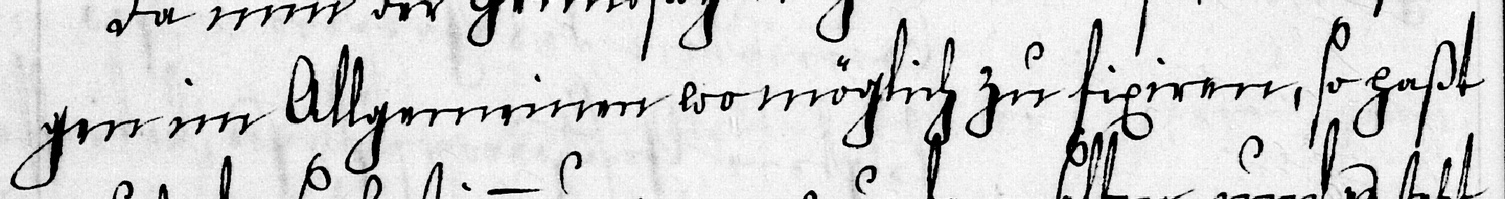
ngen im Allgemeinen wo möglich zu fixiren, so paßt
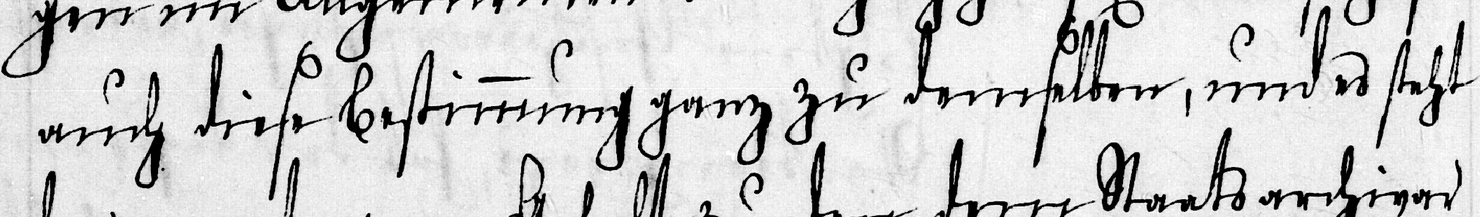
auch diese Bestimmung ganz zu demselben, und es steht
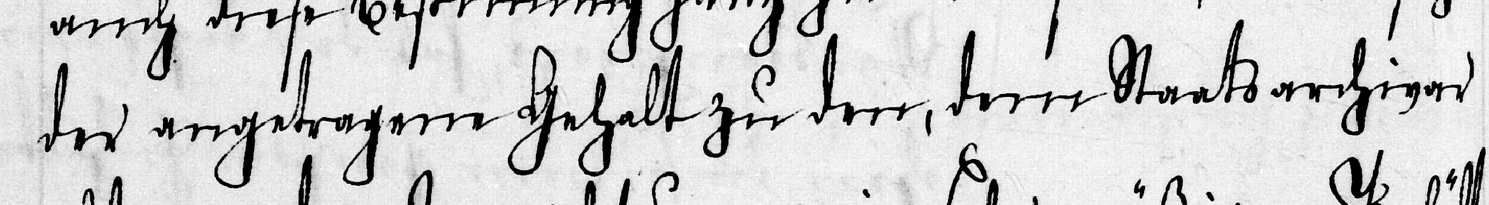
der angetragene Gehalt zu den, dem Staatsarchivar
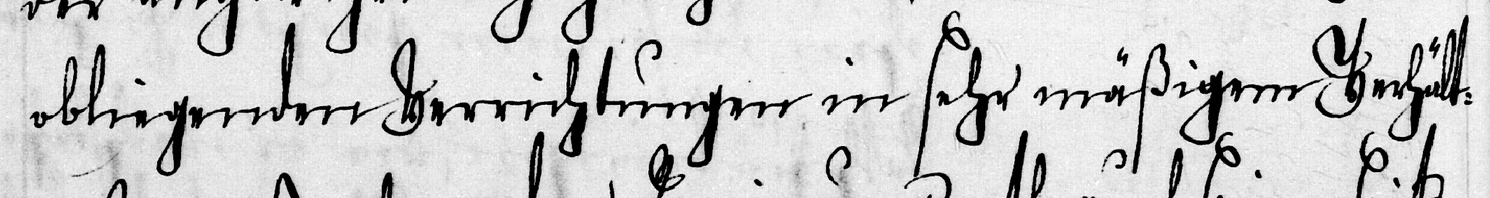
obliegenden Verrichtungen in sehr mäßigem Verhält¬
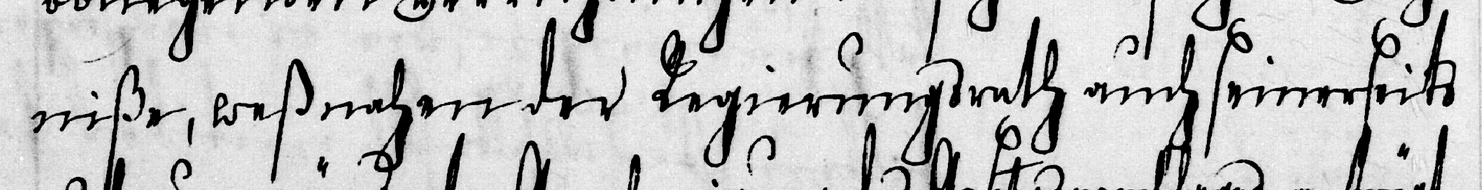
niße, weßnahen der Regierungsrath auch seinerseits
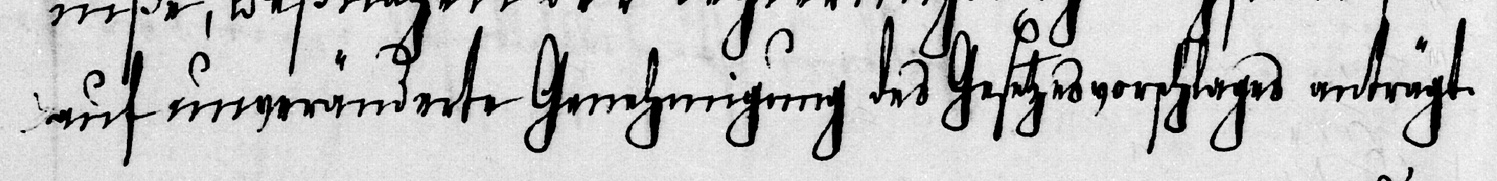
auf unveränderte Genehmigung des Gesetzesvorschlages anträgt.
